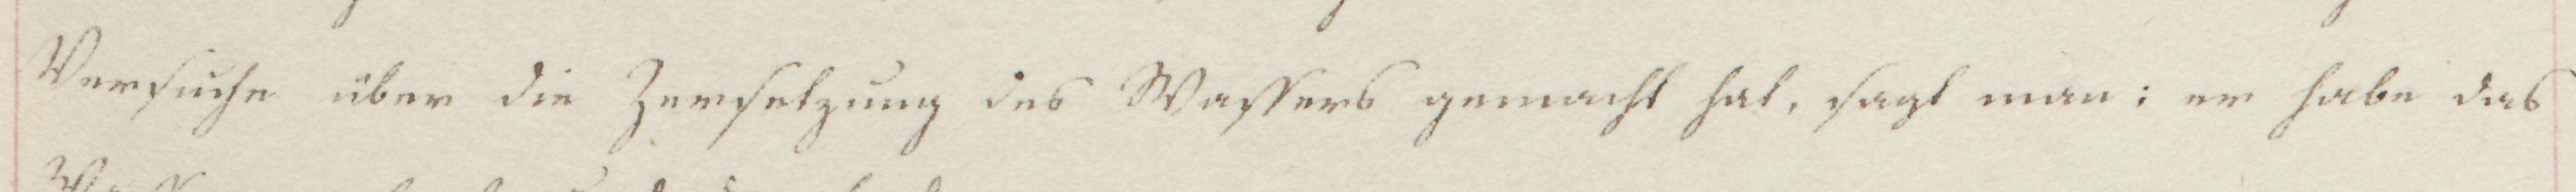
Versuche über die Zersetzung des Wassers gemacht hat, sagt man: er habe das
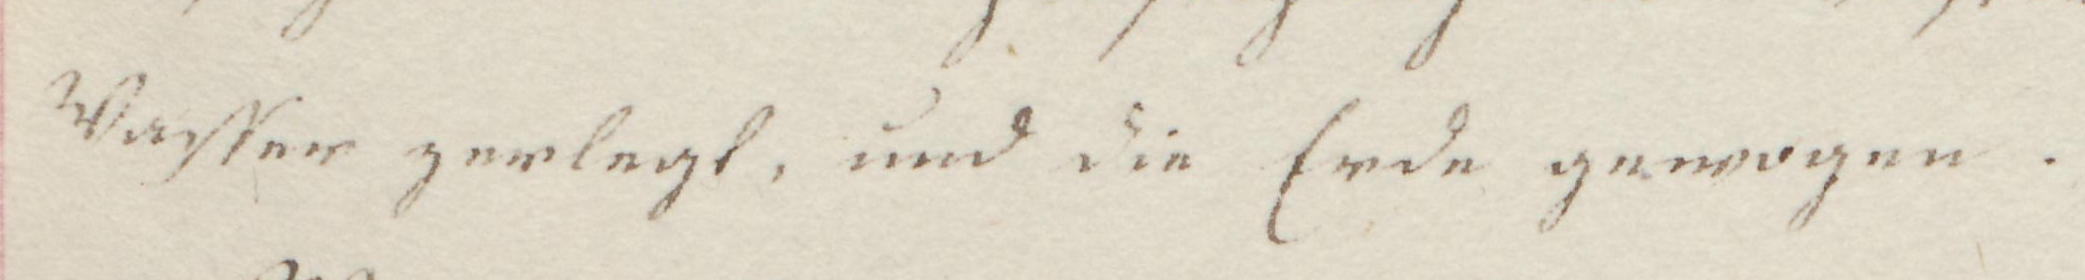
Wasser zerlegt und die Erde gewogen.
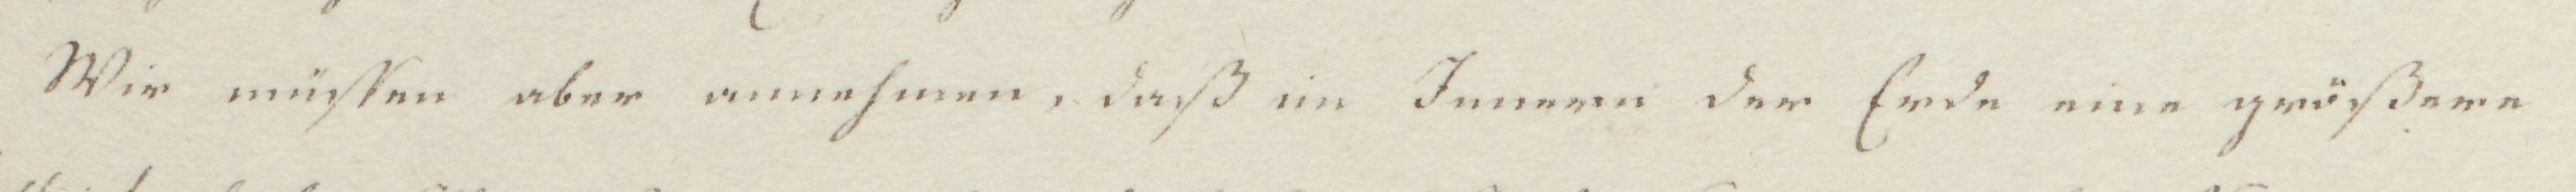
Wir müssen aber annehmen, daß im Innern der Erde eine größere
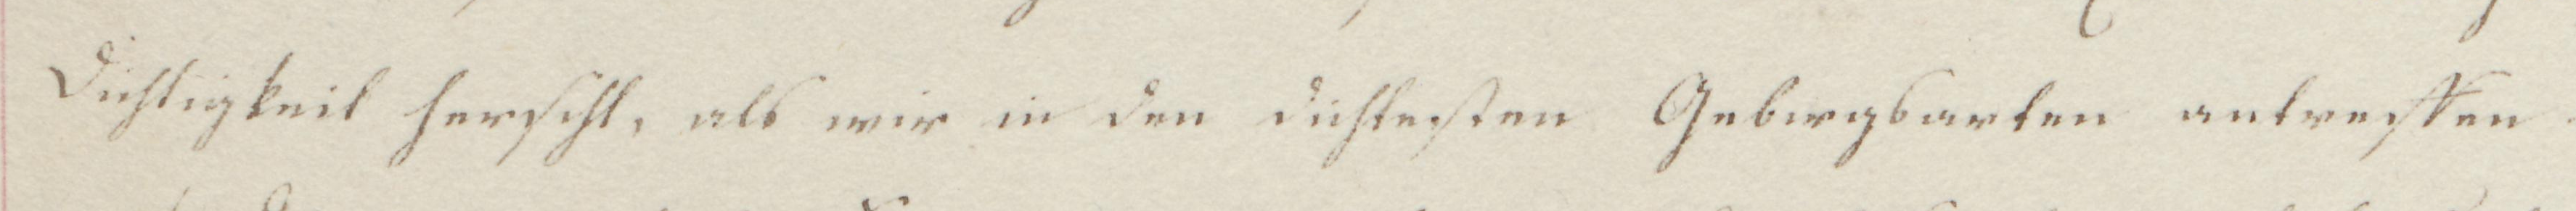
Dichtigkeit herscht, als wir in den dichtesten Gebirgsarten antreffen.
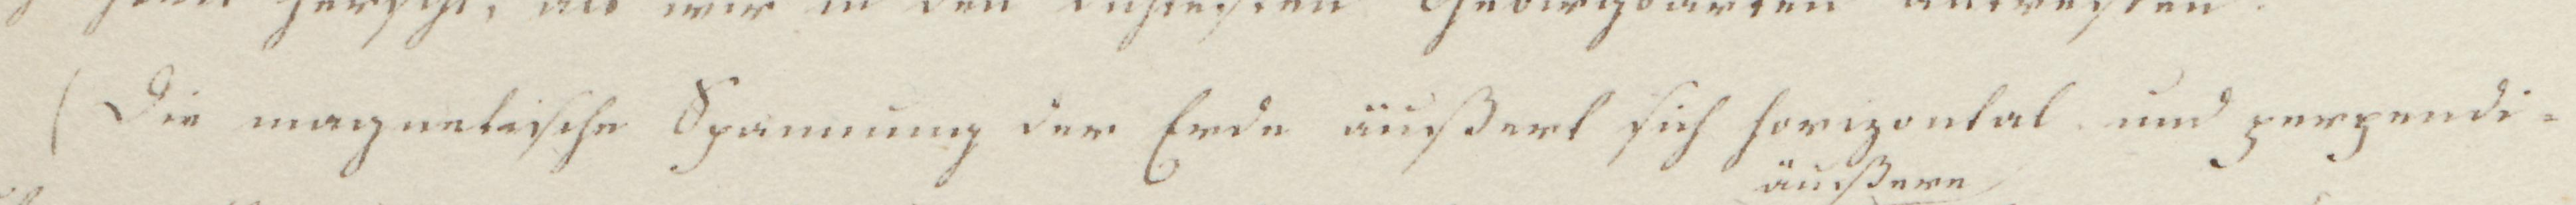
(Die magnetische Spannung der Erde äußert sich horizontal und perpendi-
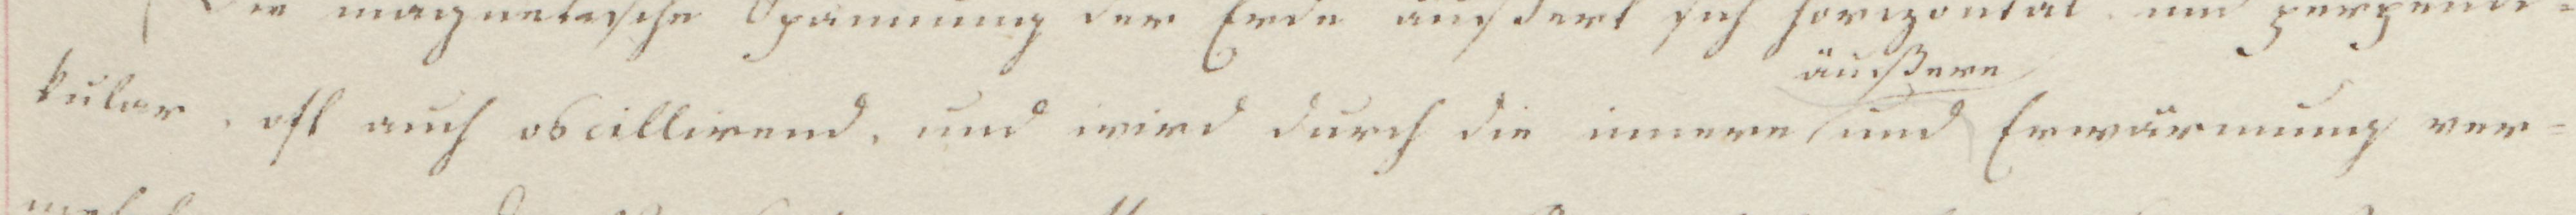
kular, oft auch oscillirend, und wird durch die innere und äußere Erwärmung ver-
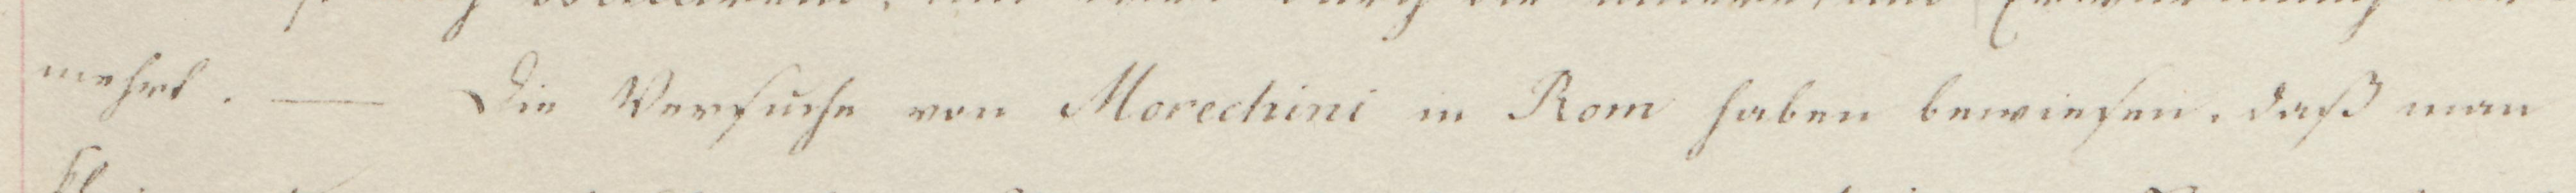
mehrt. – Die Versuche von Morechini in Rom haben bewiesen, daß man
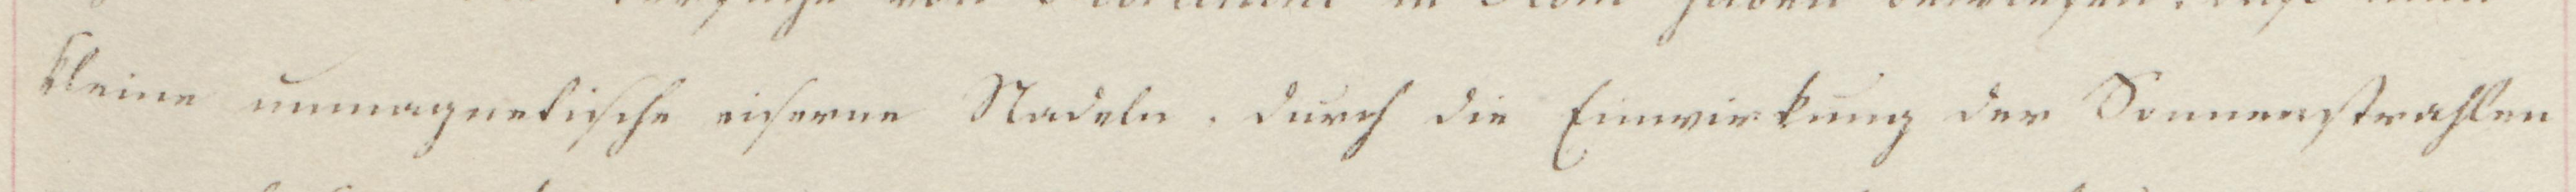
kleine unmagnetische eiserne Nadeln, durch die Einwirkung der Sonnenstrahlen
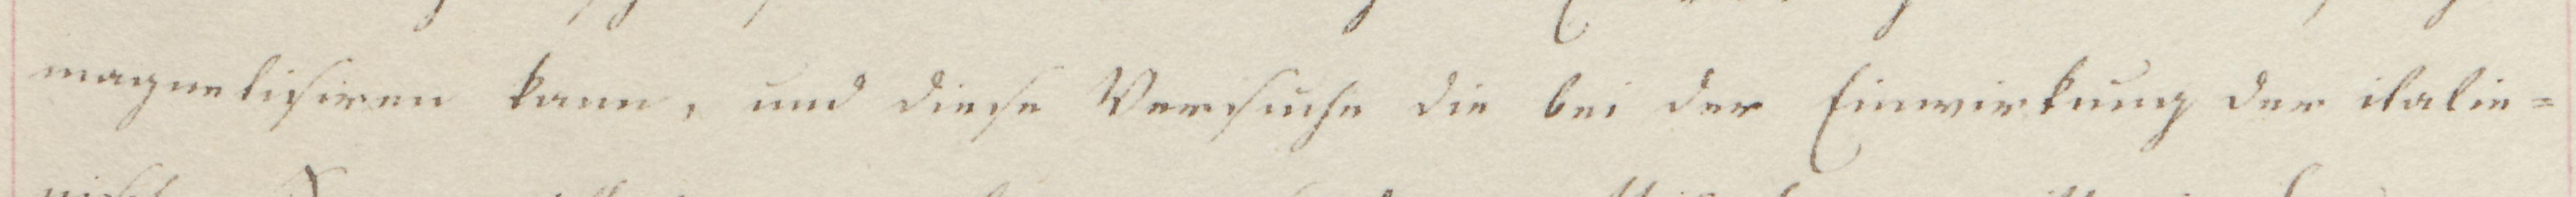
magnetisiren kann, und diese Versuche die bei der Einwirkung der italie-
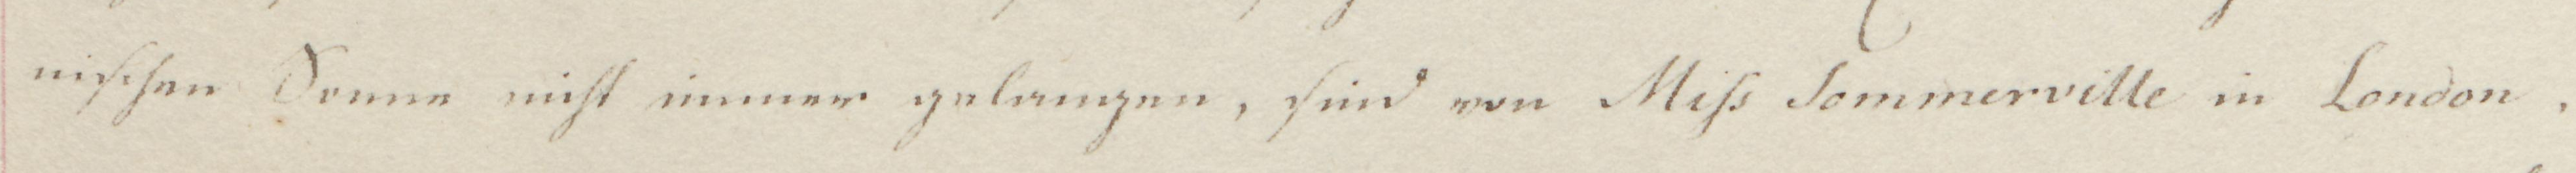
nischen Sonne nicht immer gelangen, sind von Miss Sommerville in London,
